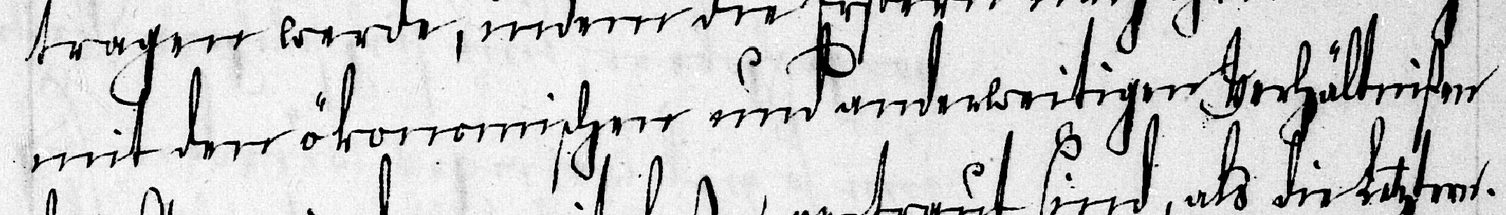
mit den ökonomischen und anderweitigen Verhältnißen
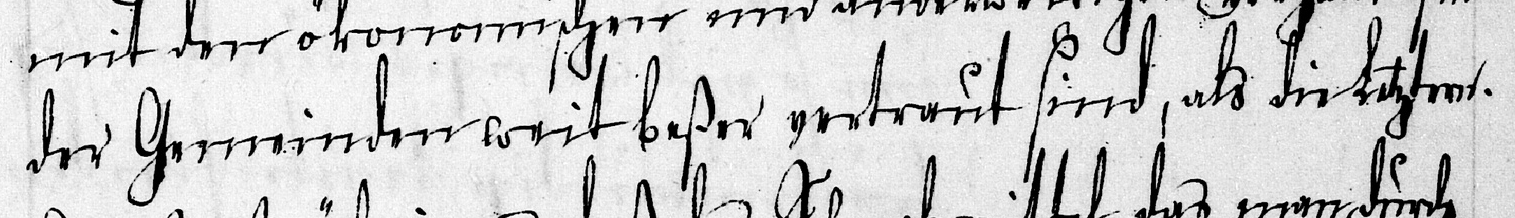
der Gemeinden weit beßer vertraut, sind als die Letzter¬
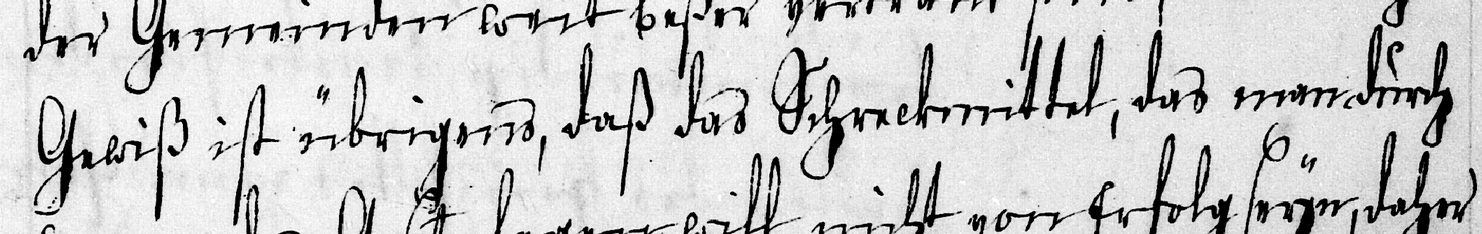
Gewiß ist übrigens, daß das Schreckmittel, das man durch
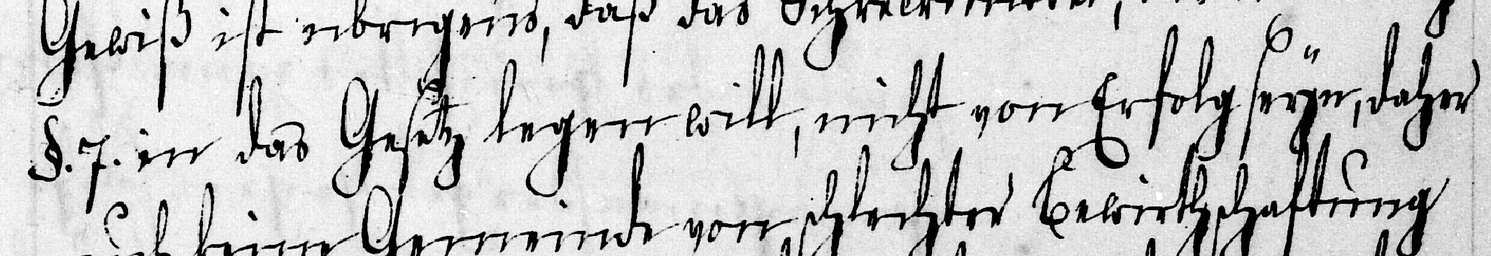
7. in das Gesetz legen will, nicht von Erfolg seyn, daher
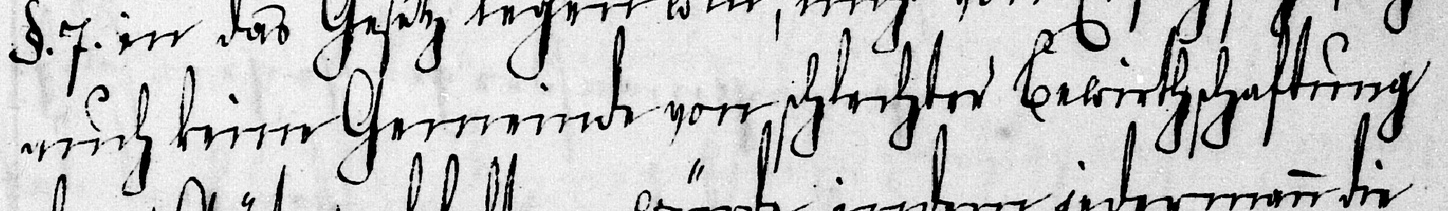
auch keine Gemeinde von schlechter Bewirthschaftung
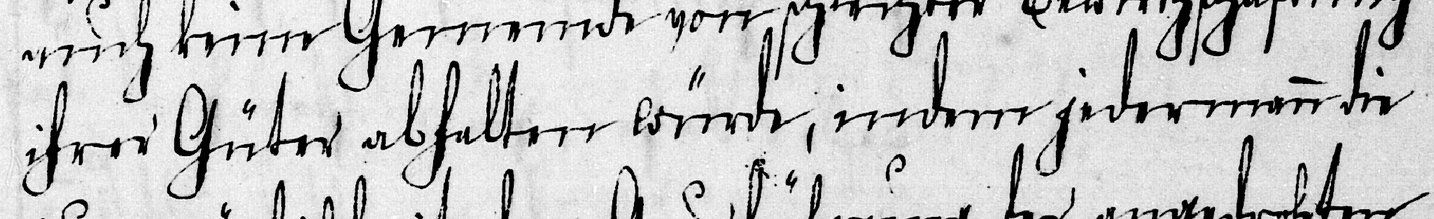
ihrer Güter abhalten würde, indem jedermann die
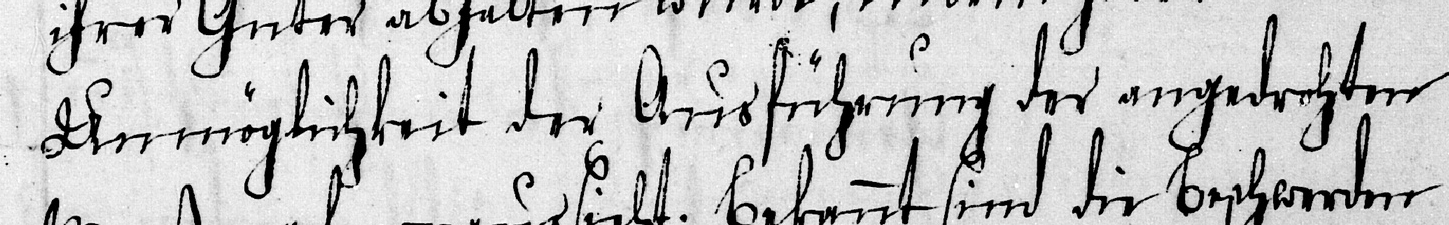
Unmöglichkeit der Ausführung der angedrohten
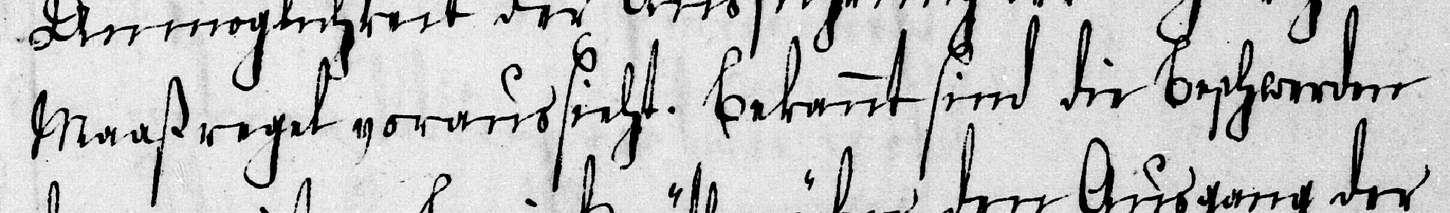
Maaßregel voraussieht. Bekannt sind die Beschwerden
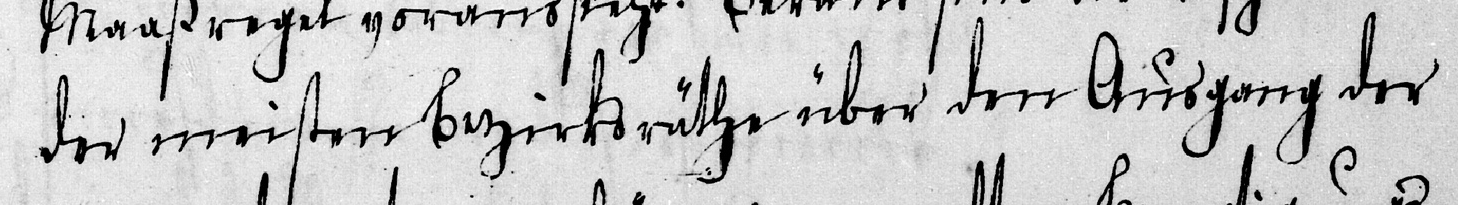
der meisten Bezirksräthe über den Ausgang der
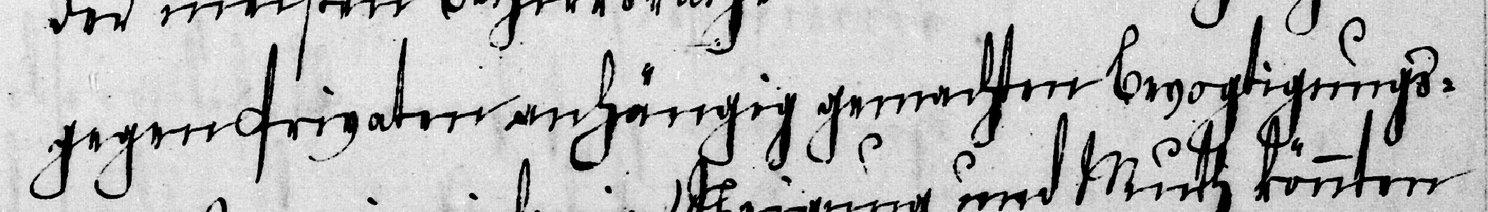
gegen Privaten anhängig gemachten Bevogtigungs¬
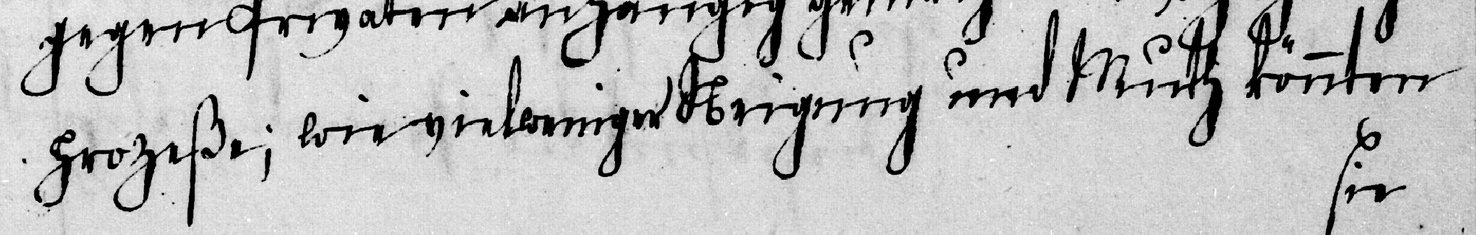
prozeße; wievielweniger Neigung und Muth könnten
